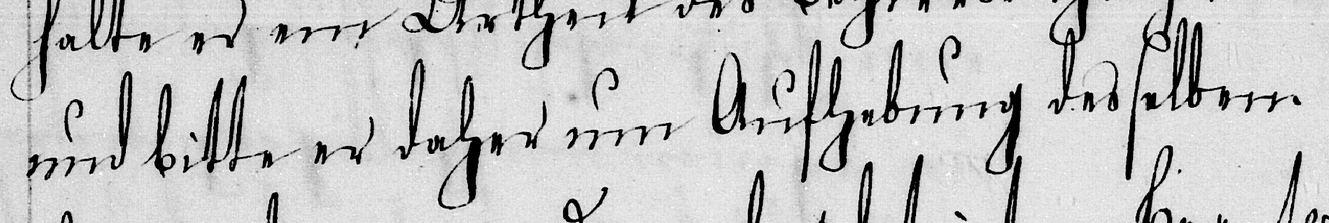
und bitte er daher um Aufhebung desselben.
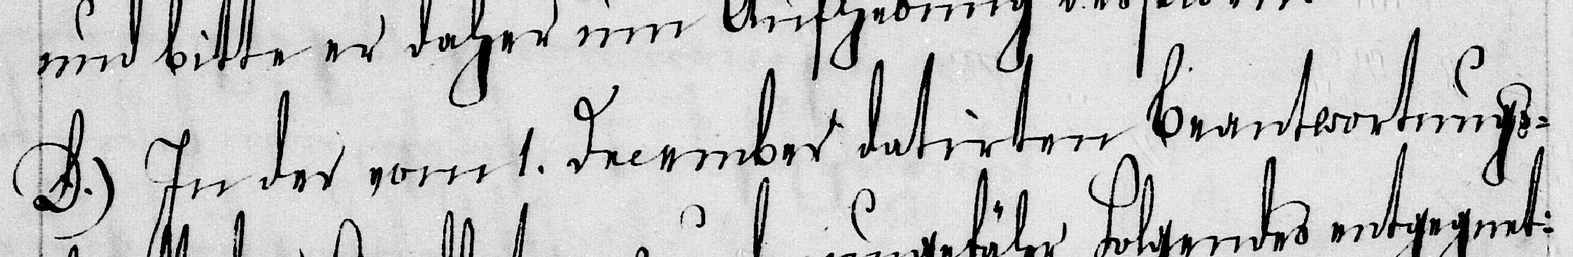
D.) In der vom 1. December datirten Beantwortungs¬
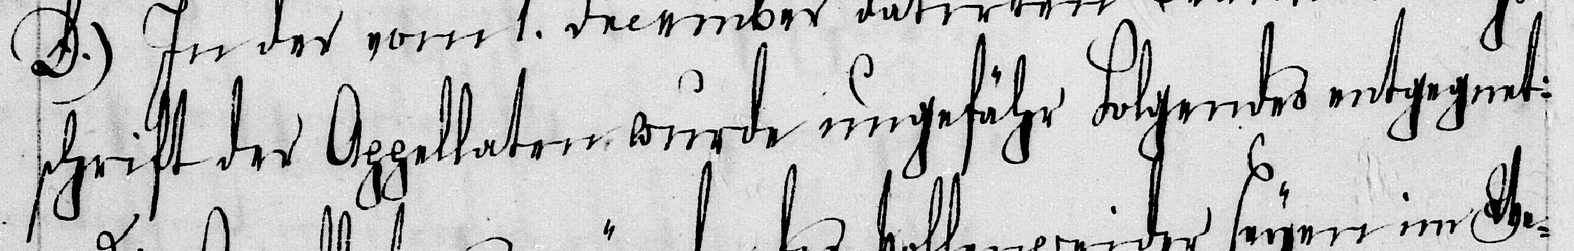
schrift der Appellaten wurde ungefähr Folgendes entgegne¬
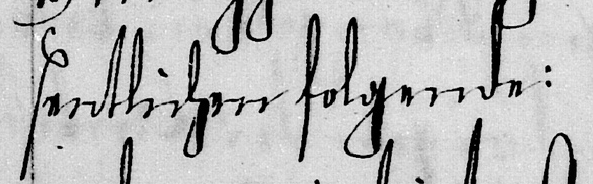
sentlichen folgende:
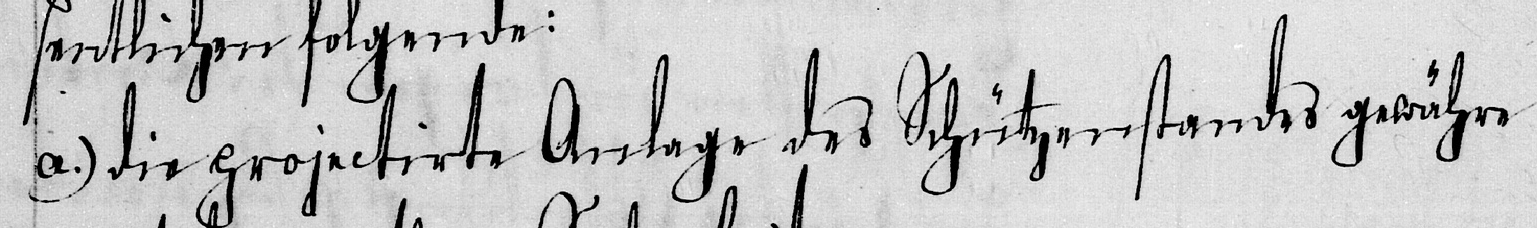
a.) die projectirte Anlage des Schützenstandes gewähre
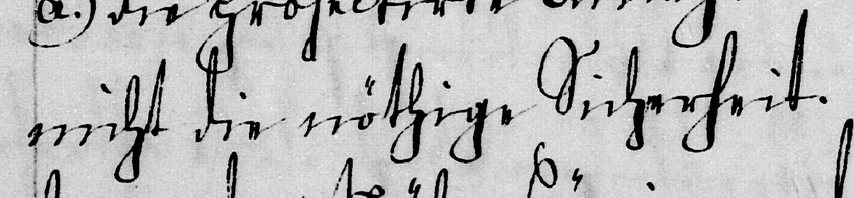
nicht die nöthige Sicherheit.
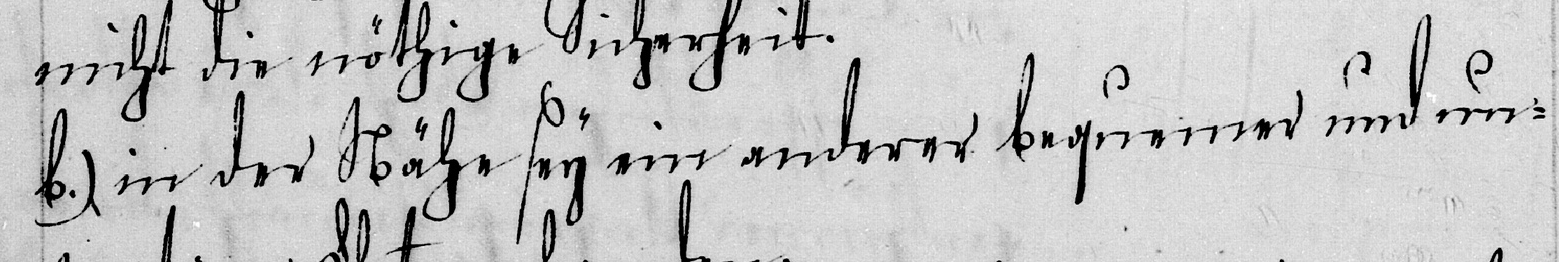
b.) in der Nähe sey ein anderer bequemer und un¬
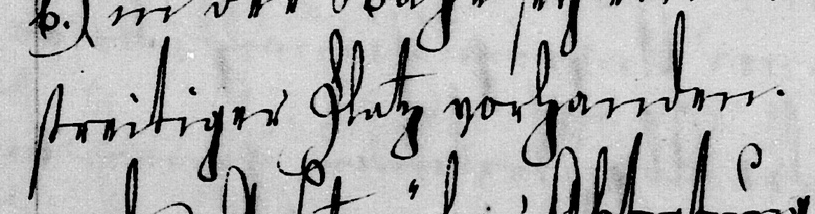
streitiger Platz vorhanden.
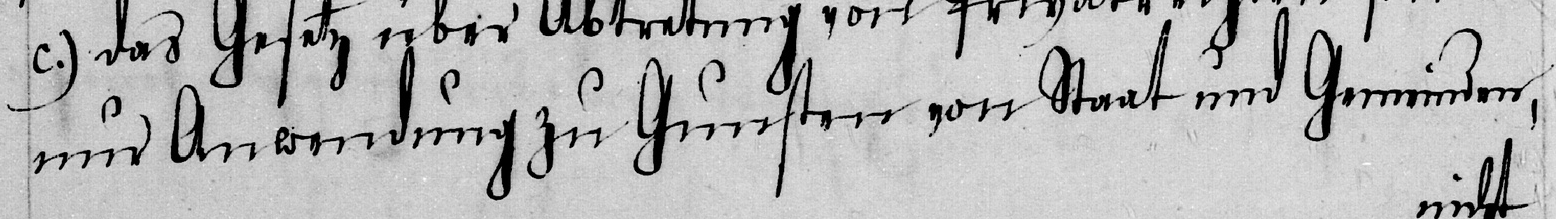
nur Anwendung zu Gunsten von Staat und Gemeinden,
